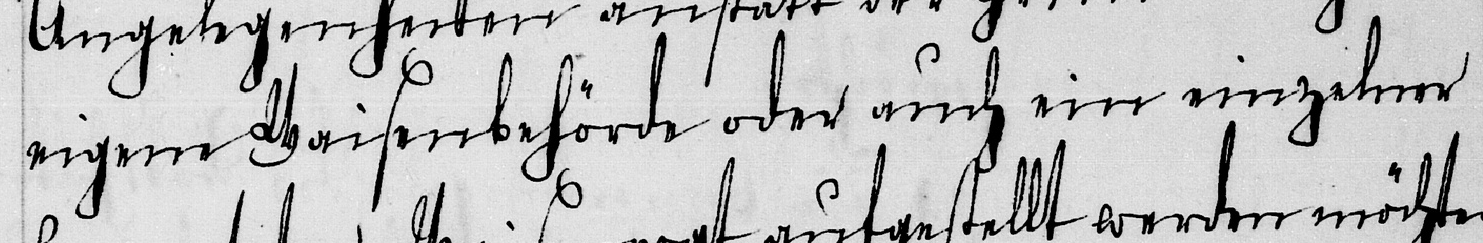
eigene Waisenbehörde oder auch ein einzelner
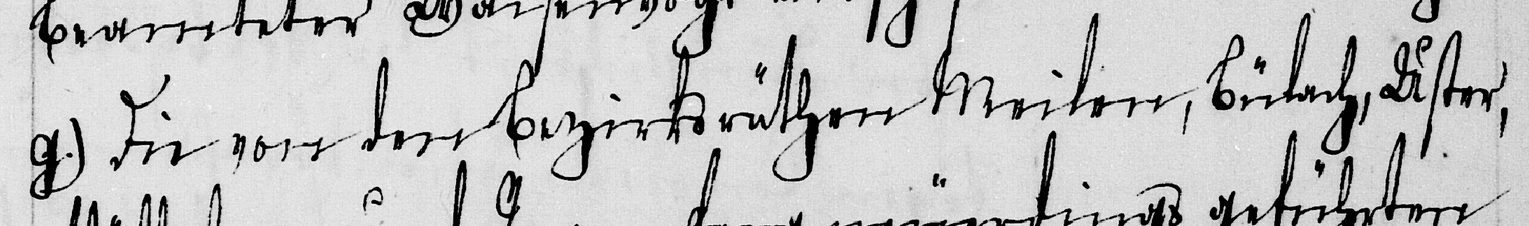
g.) Die von den Bezirksräthen Meilen, Bülach, Uster,
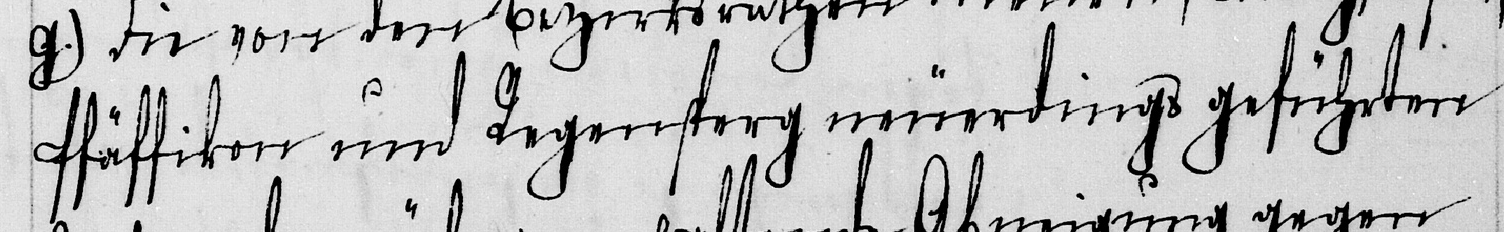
Pfäffikon und Regensperg neuerdings geführten
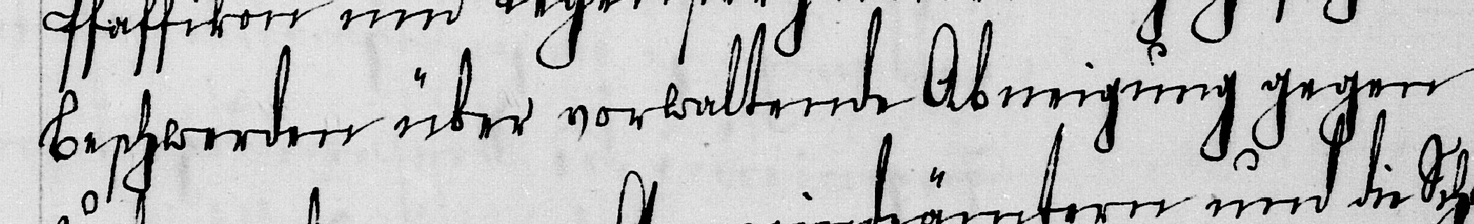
Beschwerden über vorwaltende Abneigung gegen
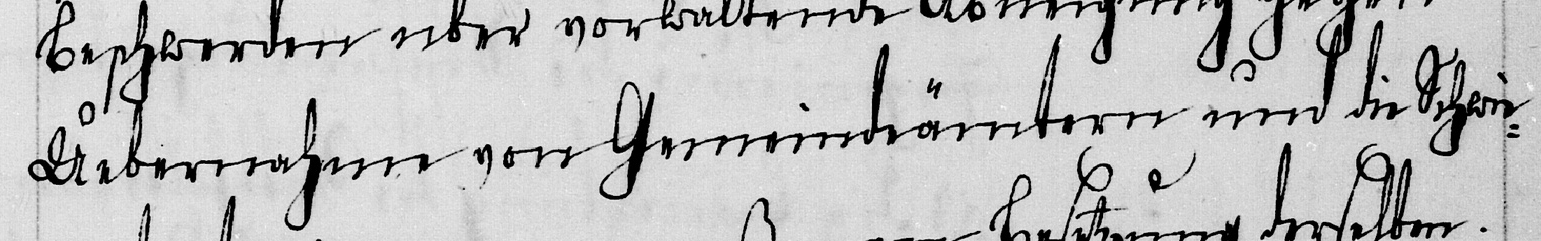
Uebernahme von Gemeindeämtern und die Schwi¬
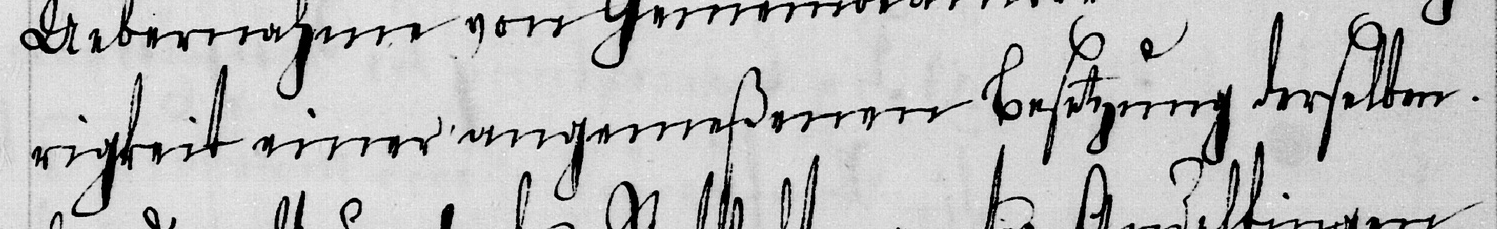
erigkeit einer angemeßenen Besetzung derselben.
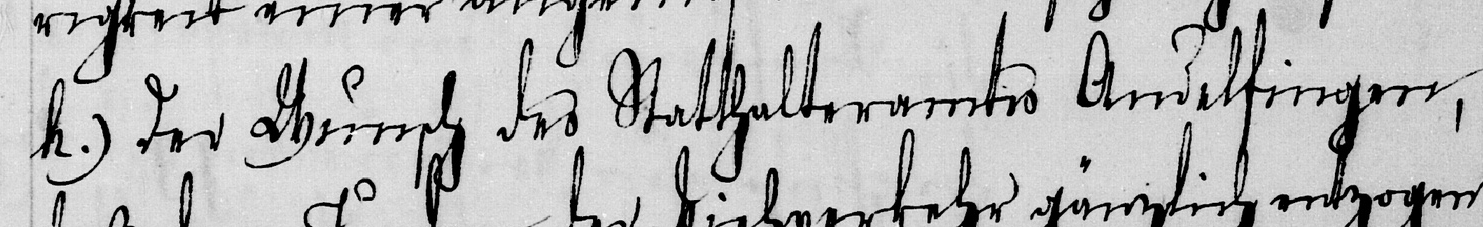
h.) Der Wunsch des Statthalteramtes Andelfingen,
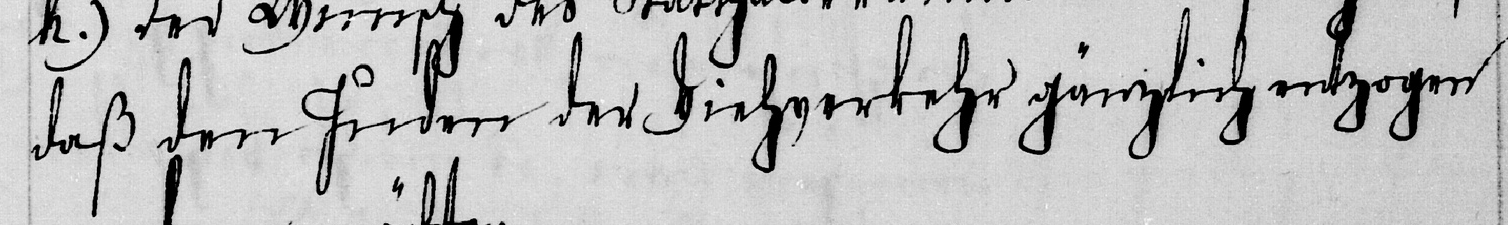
daß den Juden der Viehverkehr gänzlich entzogen
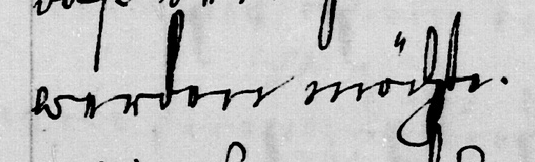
werden möchte.
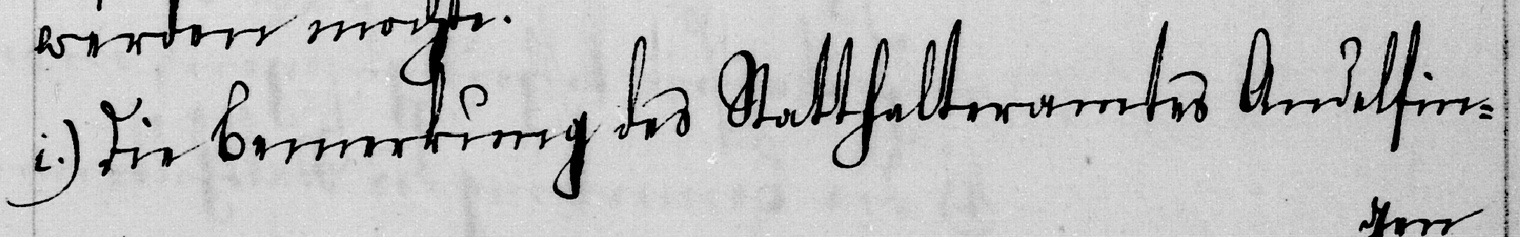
i.) Die Bemerkung des Statthalteramtes Andelfin-
